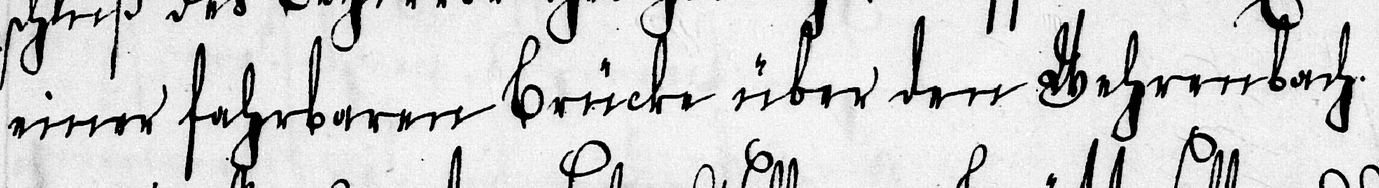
einer fahrbaren Brücke über den Wehrenbach.
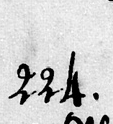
24.
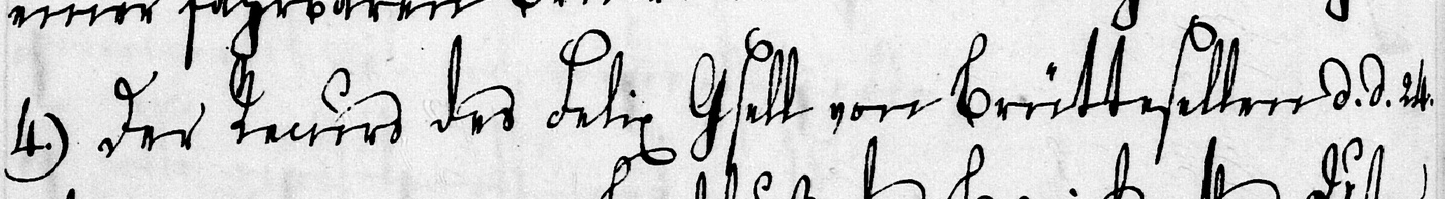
4.) Der Recurs des Felix Gsell von Brüttesellen d. d.
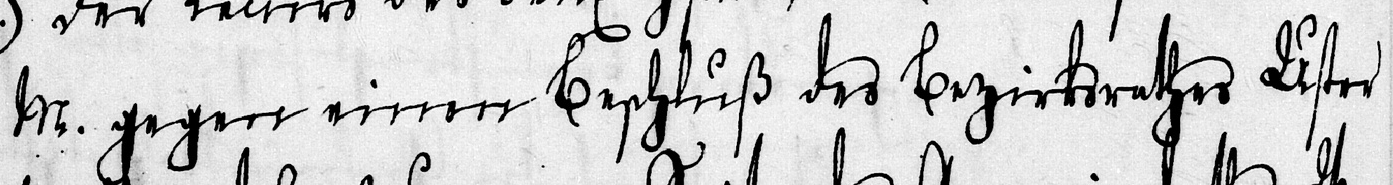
M. gegen einen Beschluß des Bezirksrathes Uster
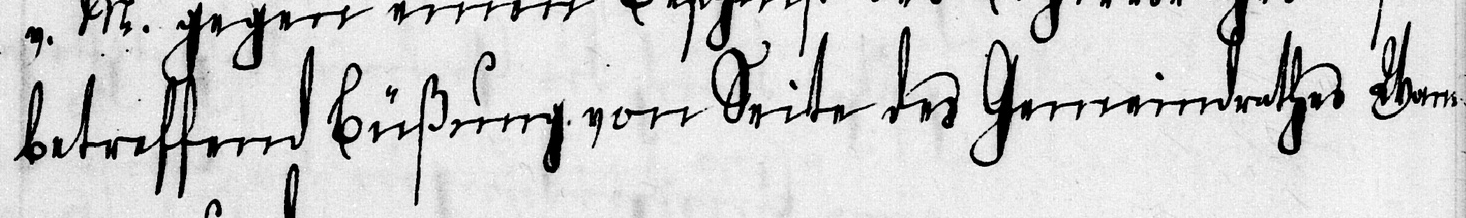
betreffend Büßung von Seite des Gemeindrathes Wan¬
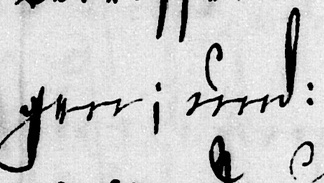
gen; und:
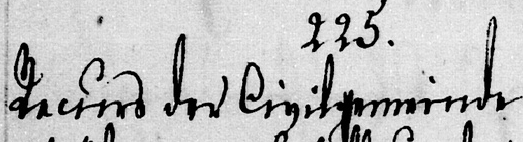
Recurs der Gemeinde
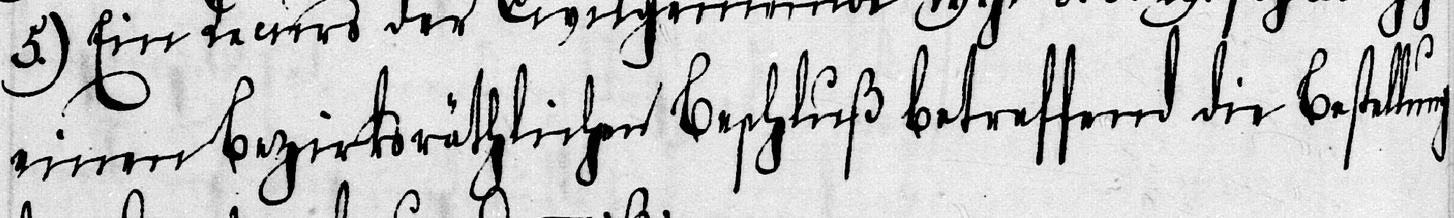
einen bezirksräthlichen Beschluß betreffend die Bestel¬
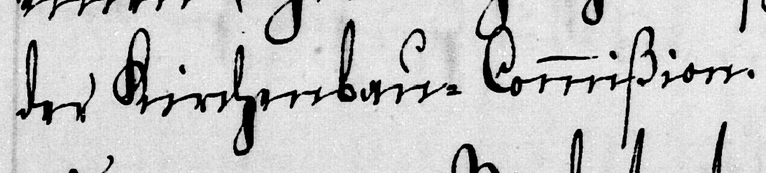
der Kirchenbau-Commißion.
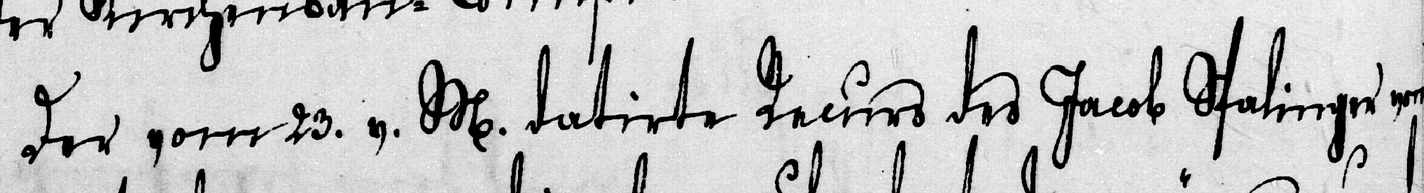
Der vom 23. v. M. datirte Recurs des Jacob Spalinger v¬
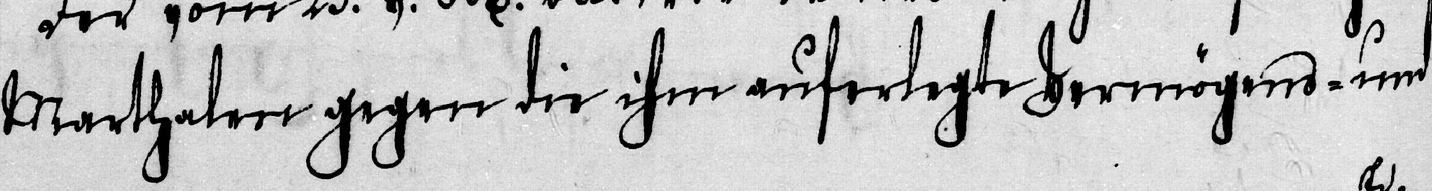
Marthalen gegen die ihm auferlegte Vermögens- und
